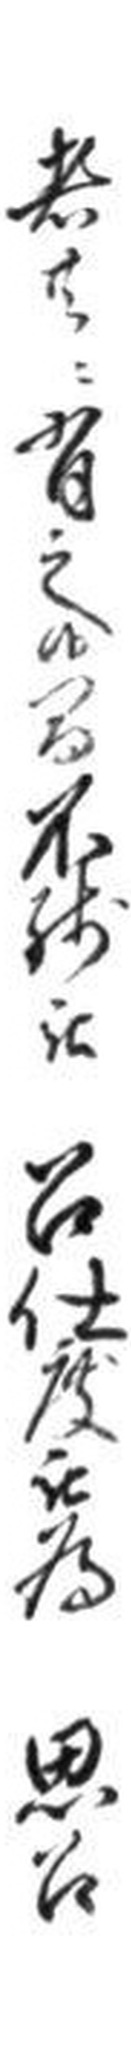者共ニ有之候間不残被召仕度被為思召
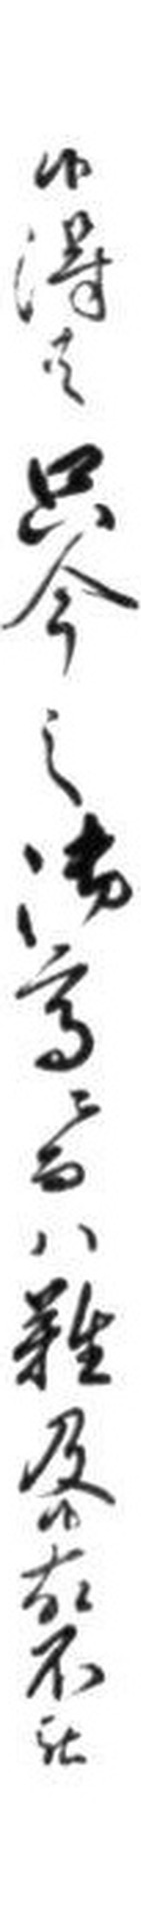候得共只今之御高ニ而ハ難及候故被
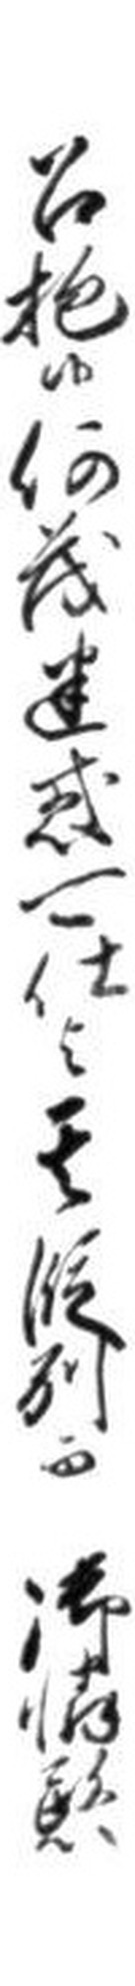召抱候何茂迷惑可仕与其段別而御憐愍
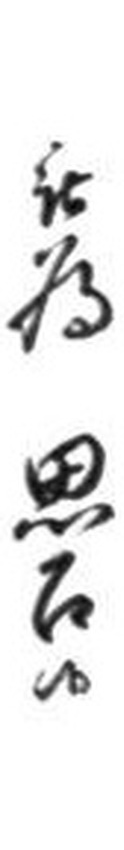被為思召候
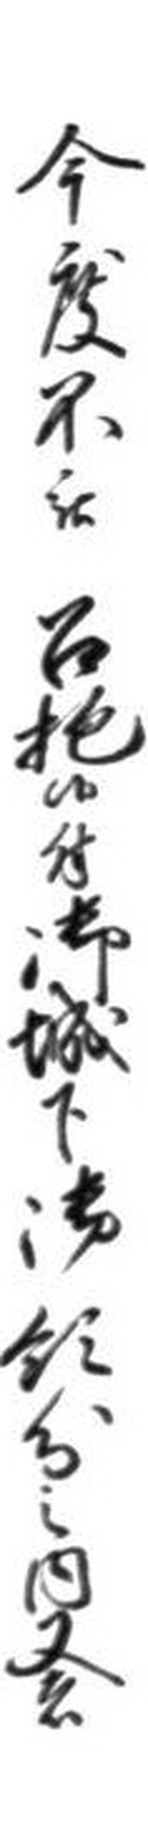今度不被召抱候付御城下御領分之内又者
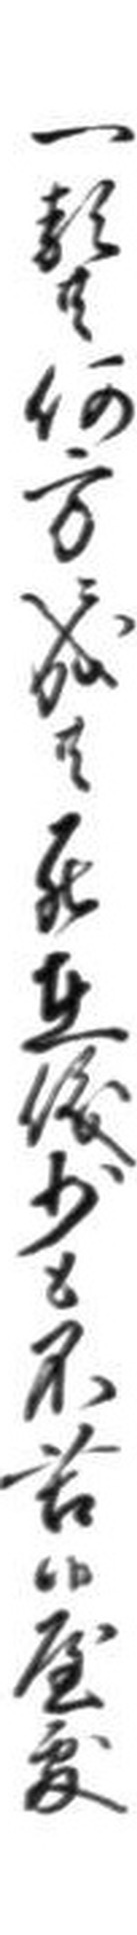一類共何方ニ成共罷在儀少も不苦候屋敷
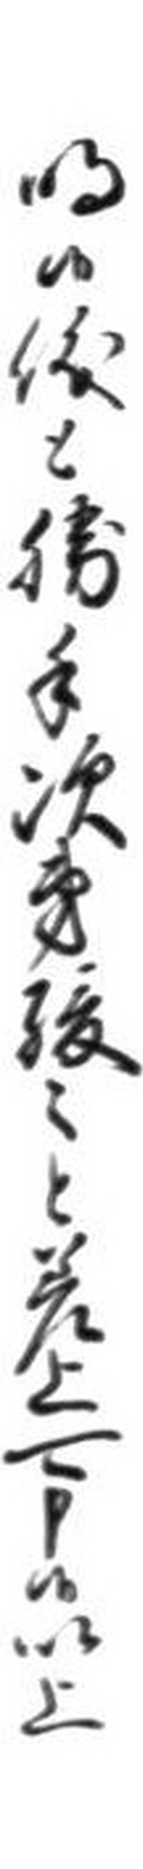明候儀も勝手次第緩々と差上可申候以上
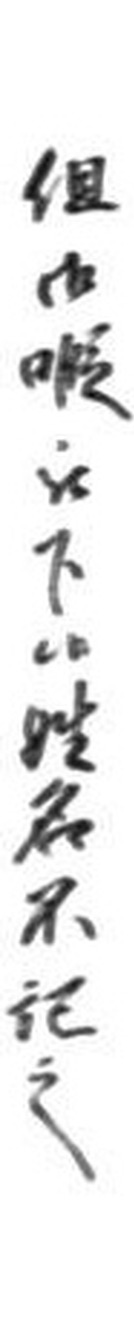但御暇被下候姓名不記之
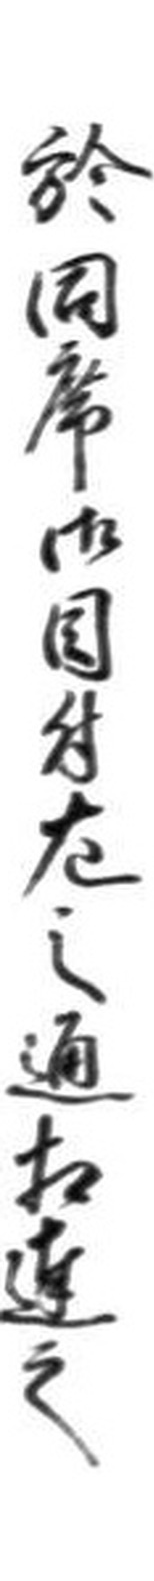於同席御目付左之通相達之
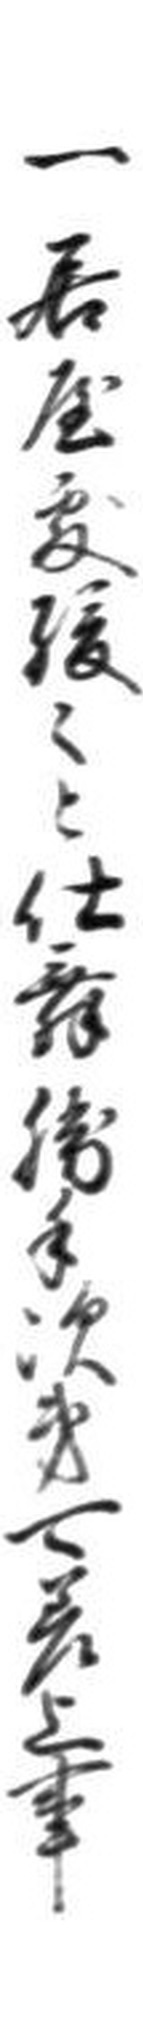一居屋敷緩々と仕舞勝手次第可差上事
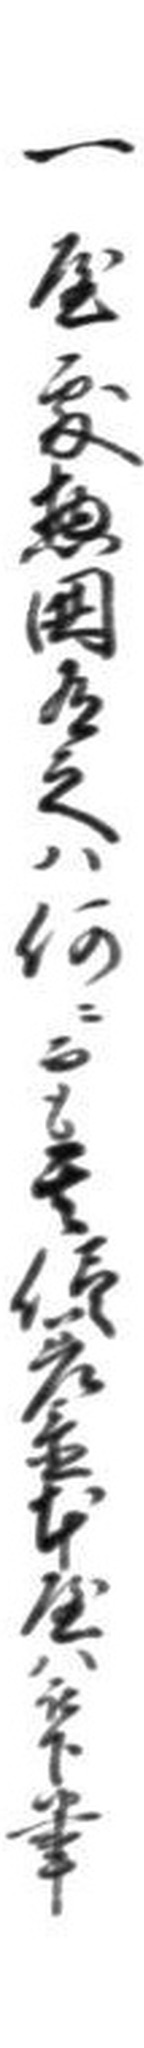一屋敷惣囲有之ハ何ニ而も其儘差置本屋ハ被下候事
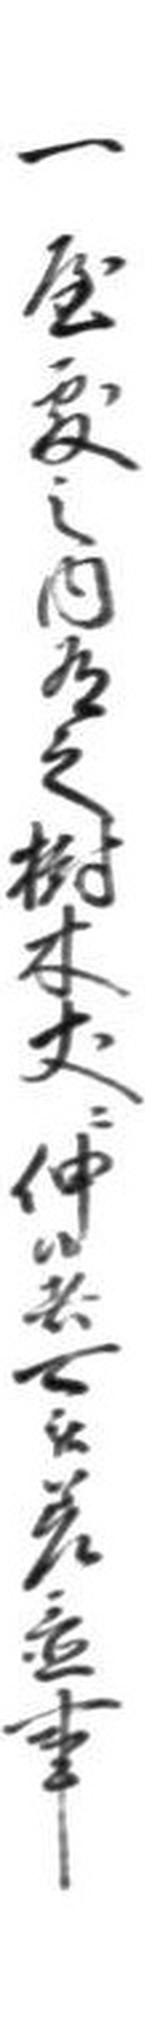一屋敷之内有之樹木丈ニ伸候者可被差置事

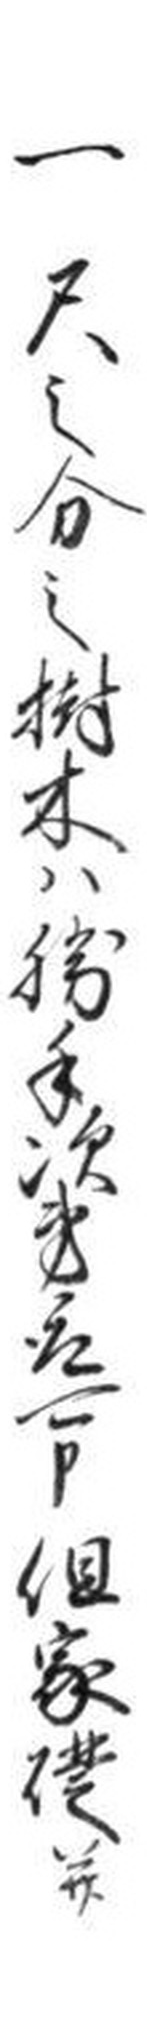一尺之分之樹木ハ勝手次第取可申但家僕并
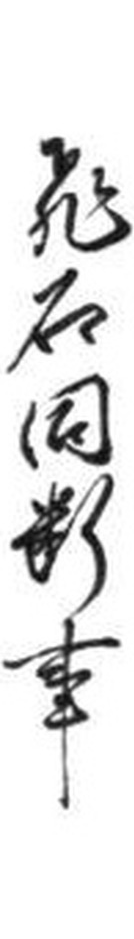飛石同断事
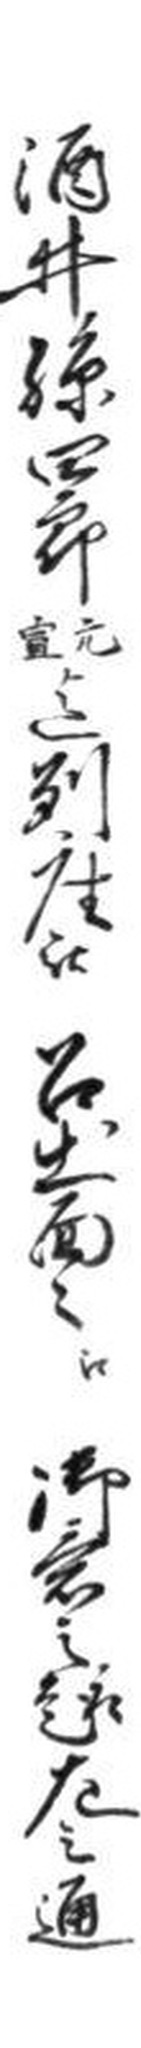酒井孫四郎元宣迄列座被召出面々江御意之趣左之通
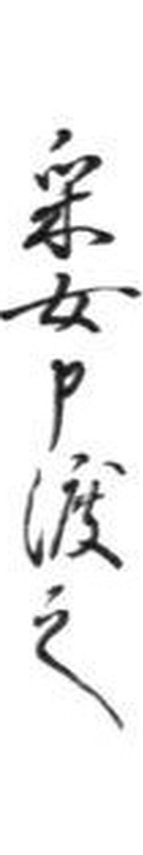采女申渡之
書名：家譜 十六 吉品公 従貞享三年閏三月到同四年
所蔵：福井県文書館 Fukui Prefectural Archives
